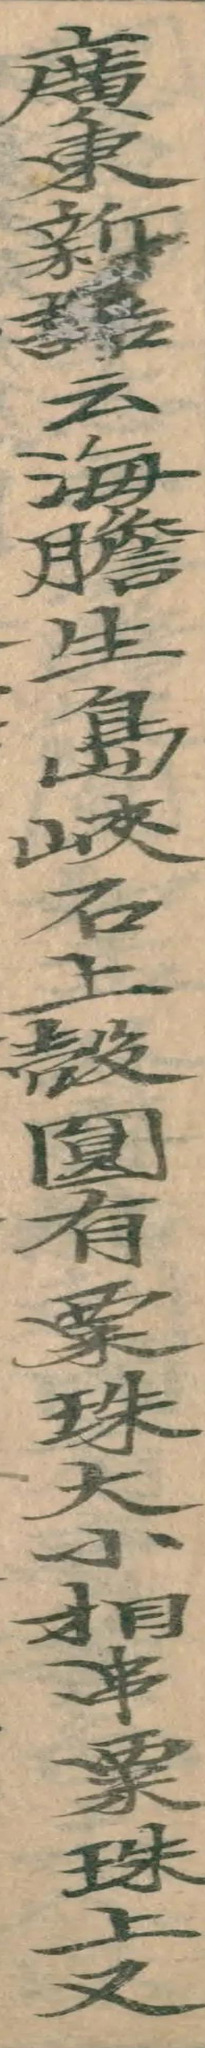廣東新語云海膽生島峡石上殻圓有粟珠大小相串粟珠上又
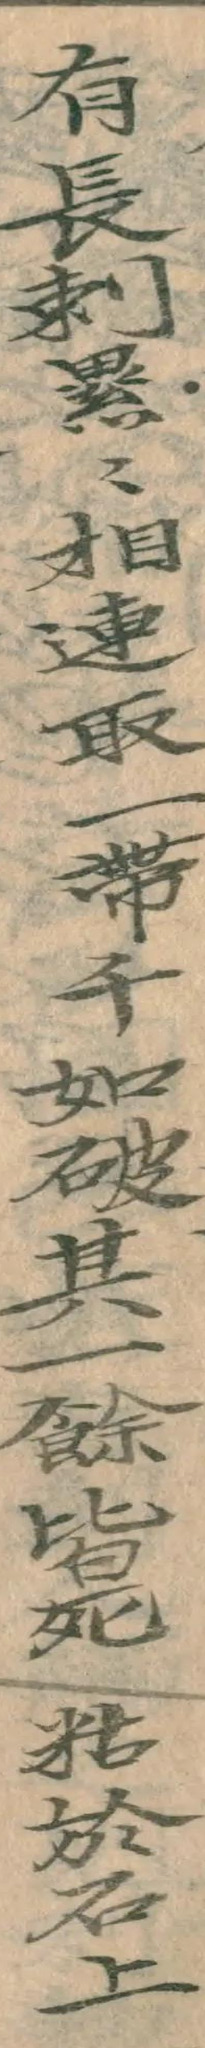有長刺累々相連取一帯千如破其一餘皆死粘於石上
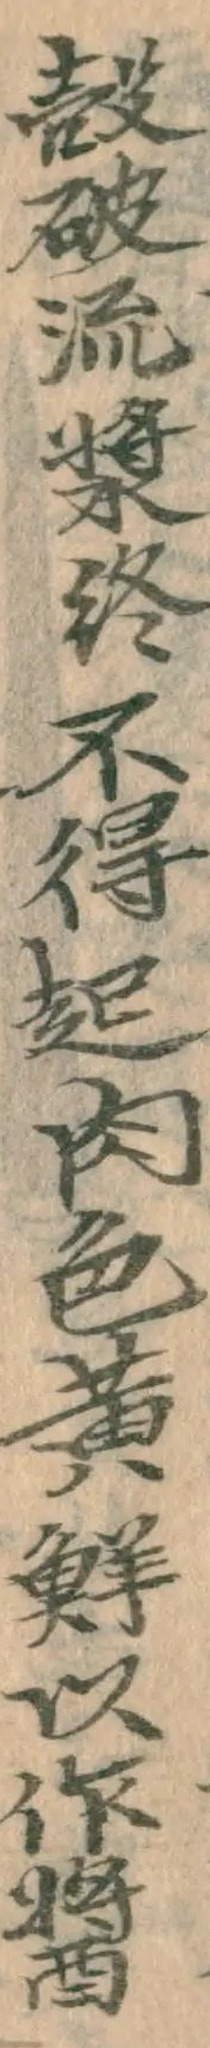殻破流漿終不得起肉色黄栓鮮以作醤
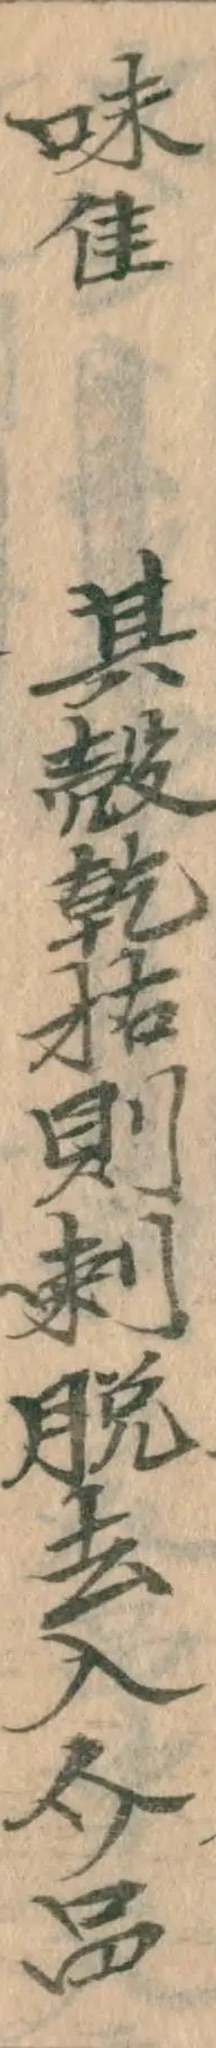味隹其殻乾枯則刺脱去入介品
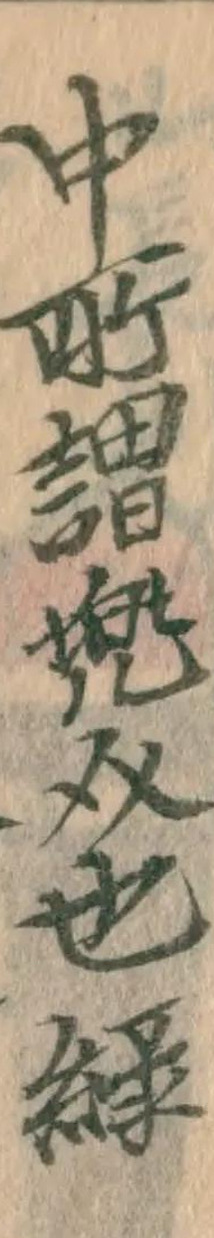中所謂兜介也緑
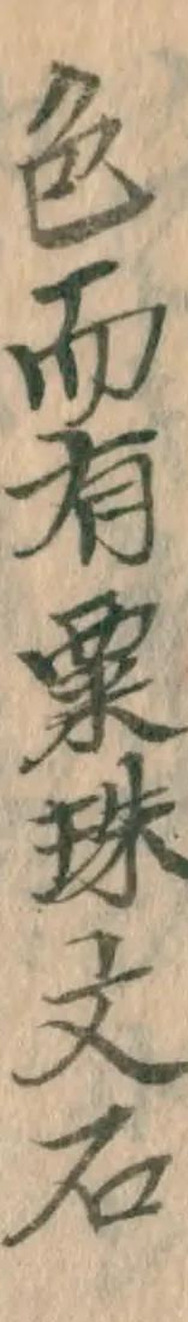色而有粟珠文石
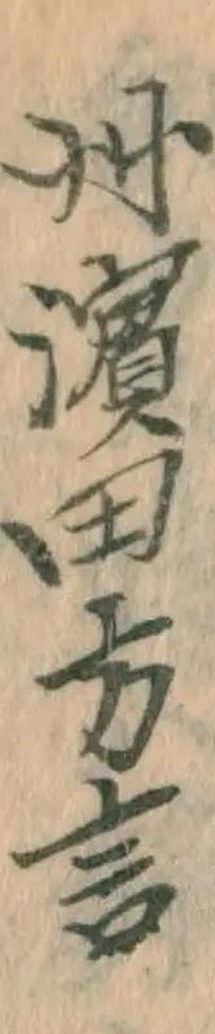州濱田方言
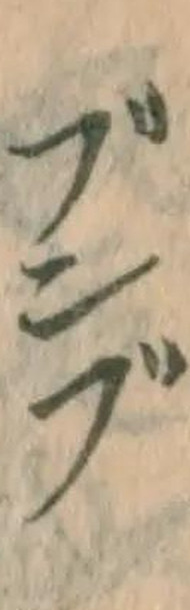ブンブ
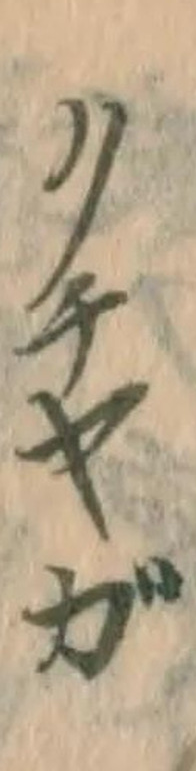クチヤカ
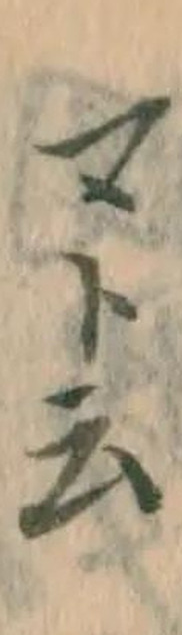マト云

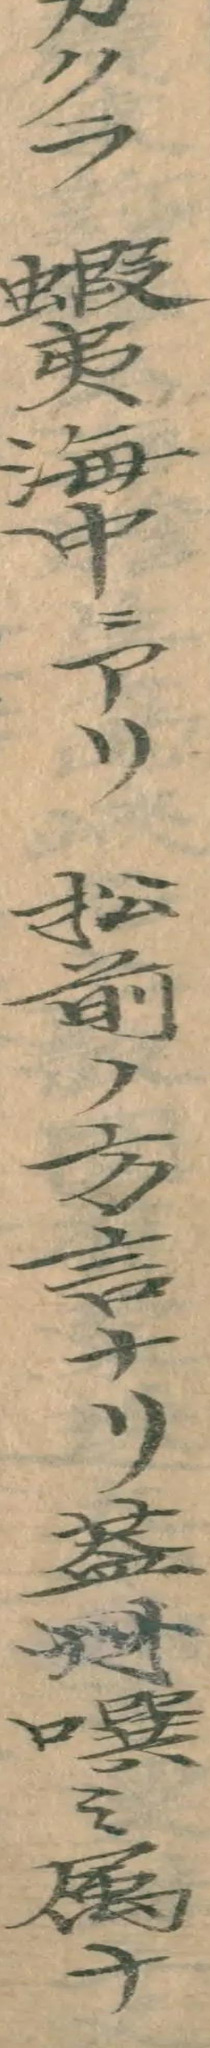カクラ蝦夷海中ニアリ松前ノ方言ナリ葢州噀ミ属ナ
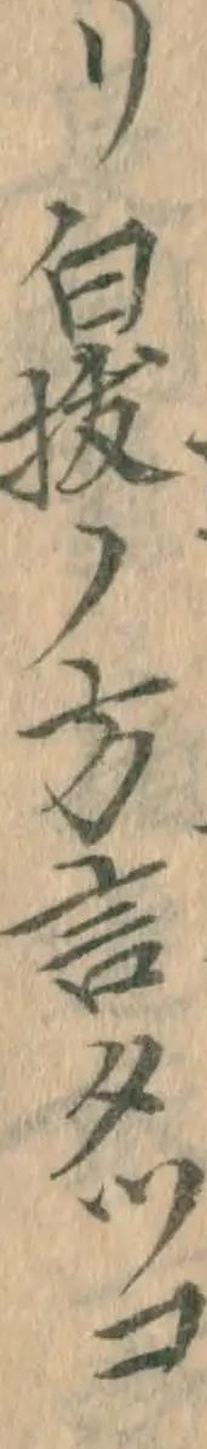リ白抜ノ方言タツコ
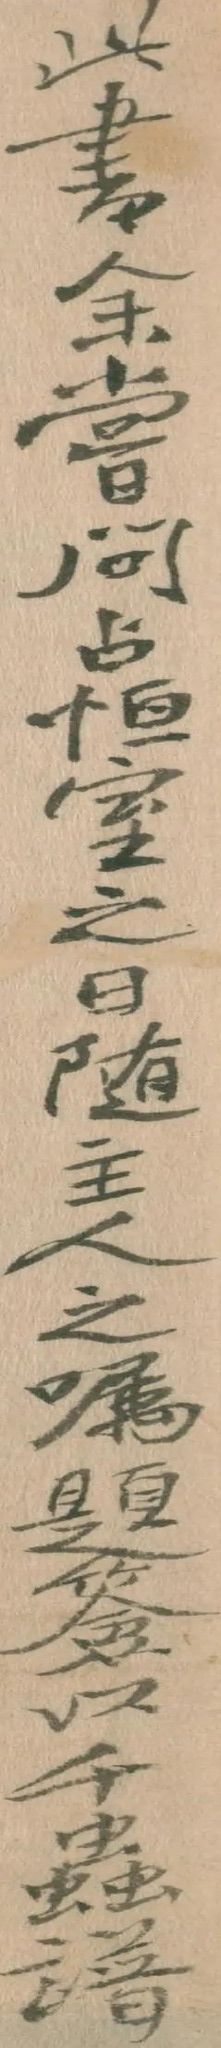此書余嘗問占恒室之日随主人之嘱題簽以千蟲譜
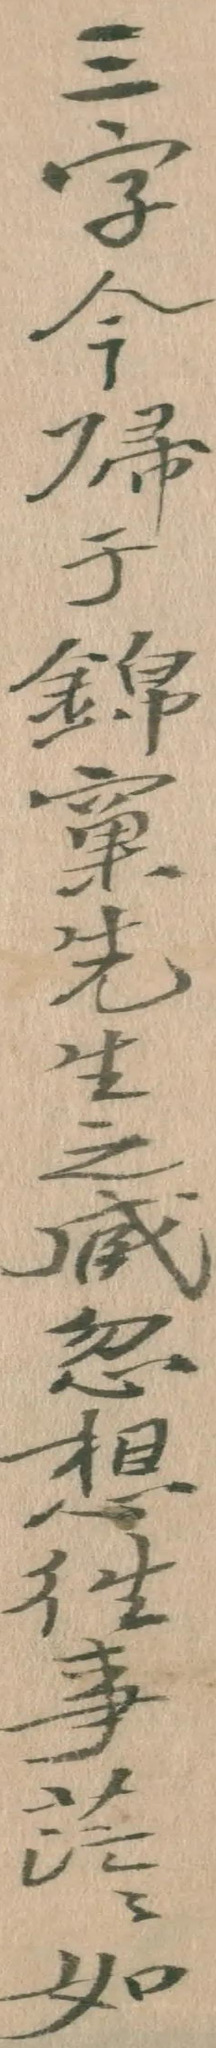三字今帰于錦窠先生之威忽想往時落々如
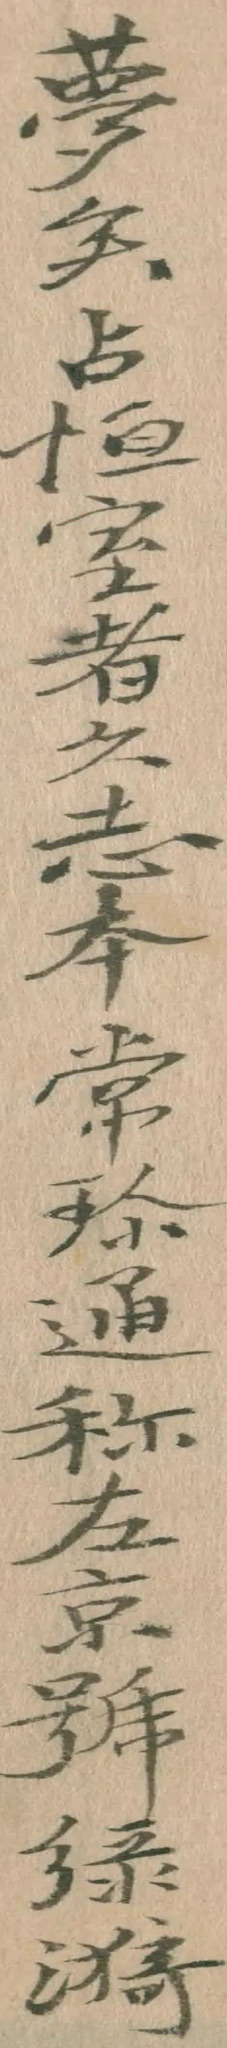夢占恒室者久志本常珎通称左京號緑漪
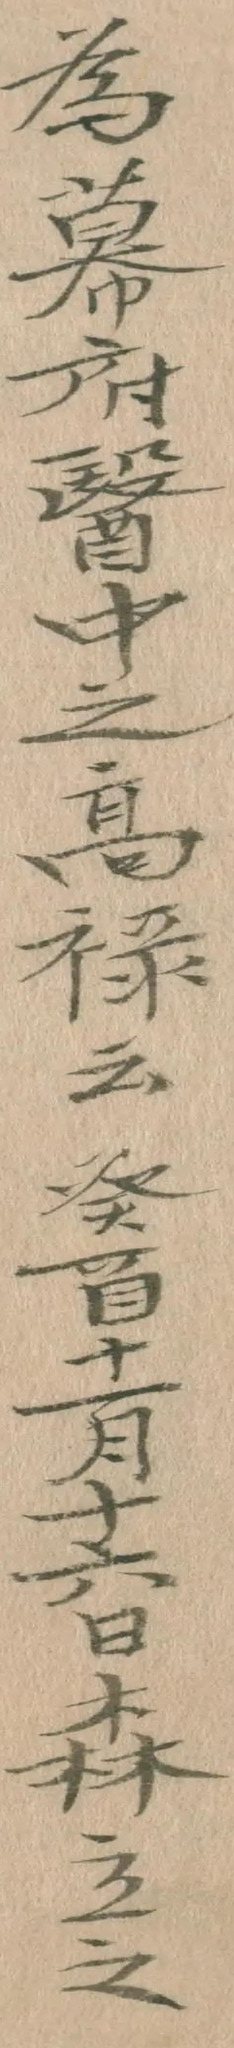為幕府醫中之高禄云癸十一月十六日森立之
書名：千蟲譜 3巻. [2]
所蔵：国立国会図書館 National Diet Library, JAPAN
